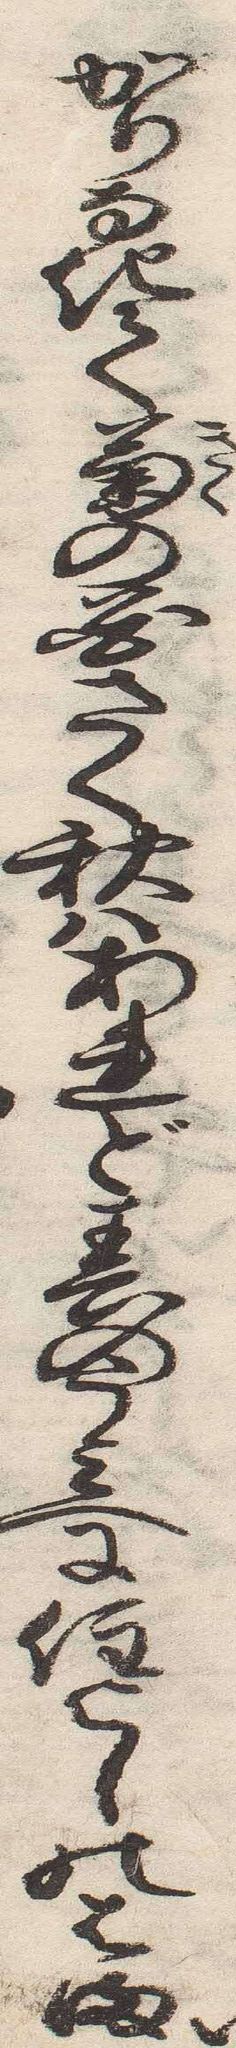かりなきて菊の花さく秋はあれど春のうみへに住よしのはま
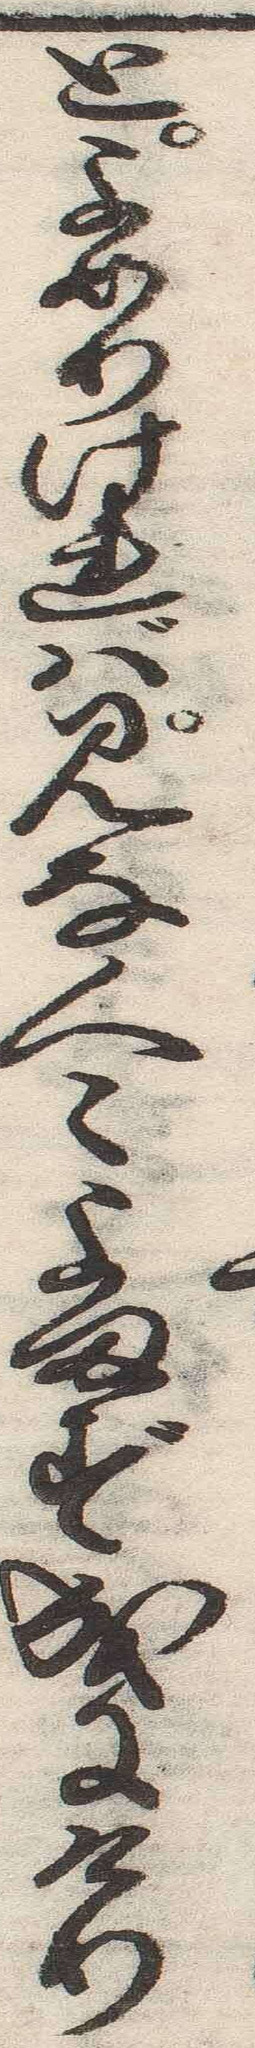と。よめりければ。みな人々よまず成にけり
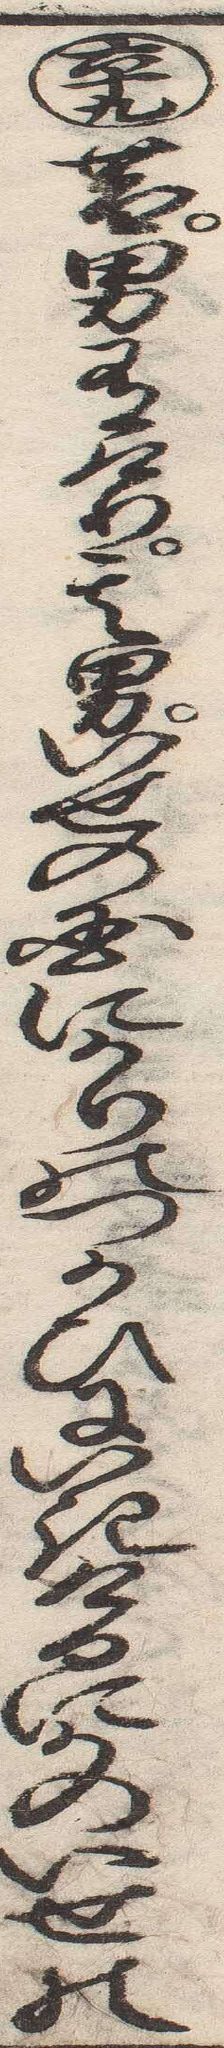六十九昔。男有けり。其男。いせの国にかりのつかひにいきけるにかのいせの
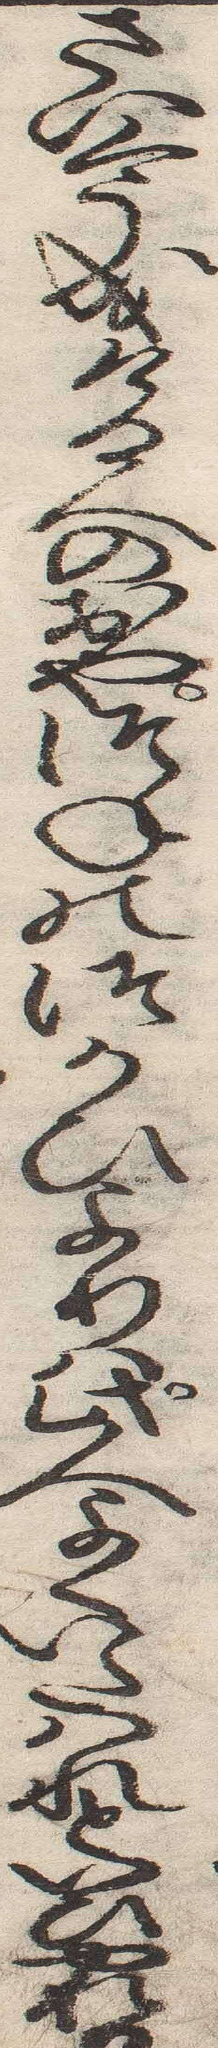さいくう成ける人のおや。つねのつかひよりは。此人よくいたはれといひやれり
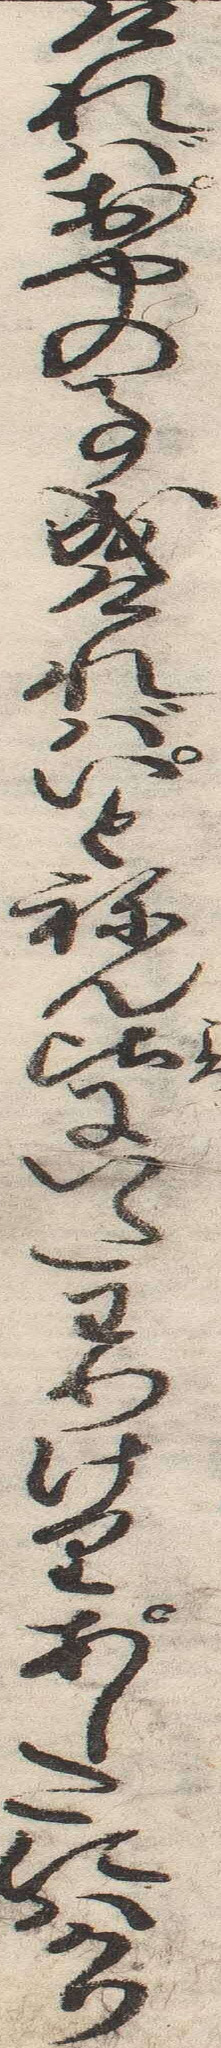ければ。おやの子成ければ。いとねん比にいたわりけり。あしたにはかり
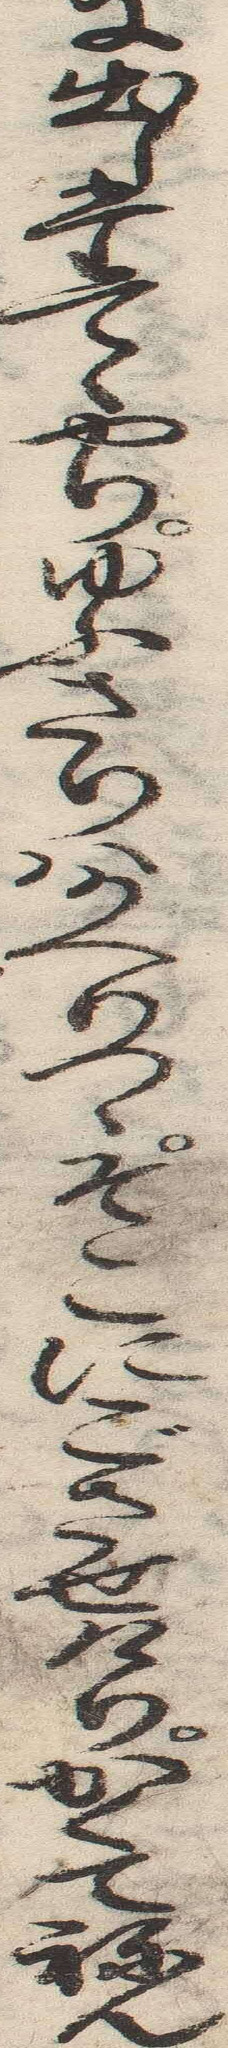に出したてゝやり。ゆふさりはかへりつゝ。そこにごさせけり。かくてねん
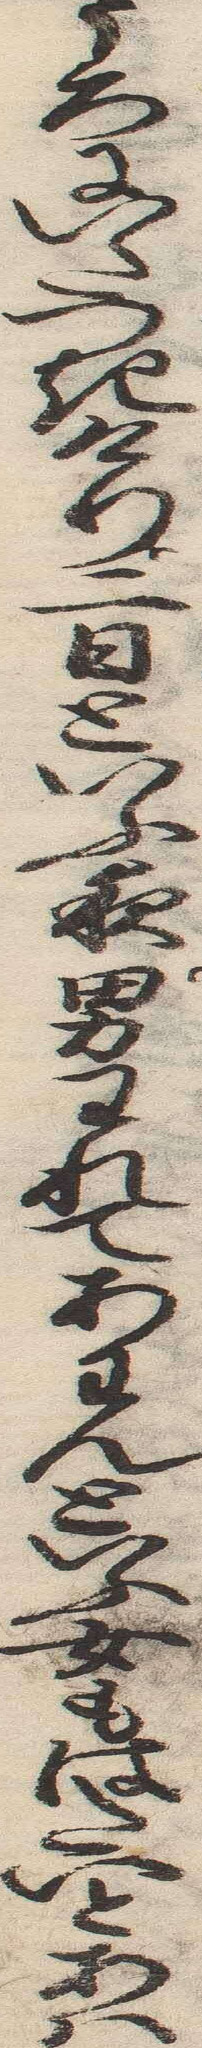ころにいたつきけり。二日といふ夜。男われてあわんといふ女もはたいとあは

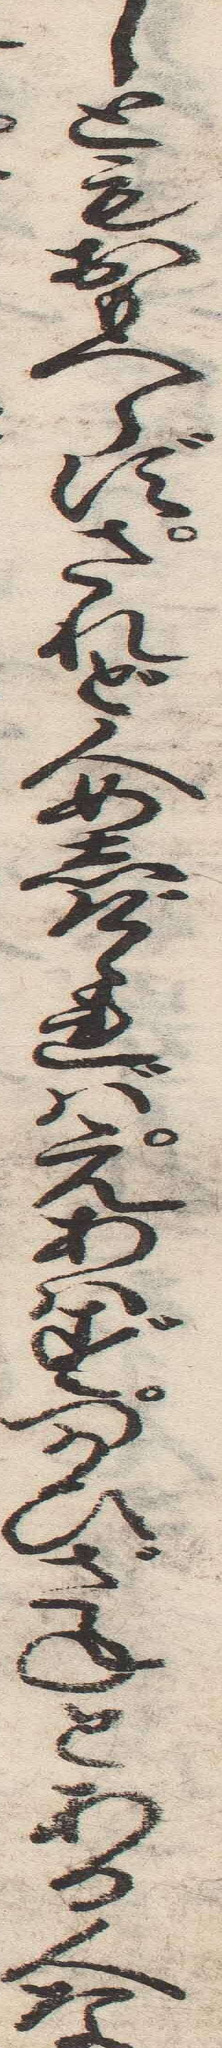しともおもへらず。されど人めしげければ。えあはず。つかひざねとある人な
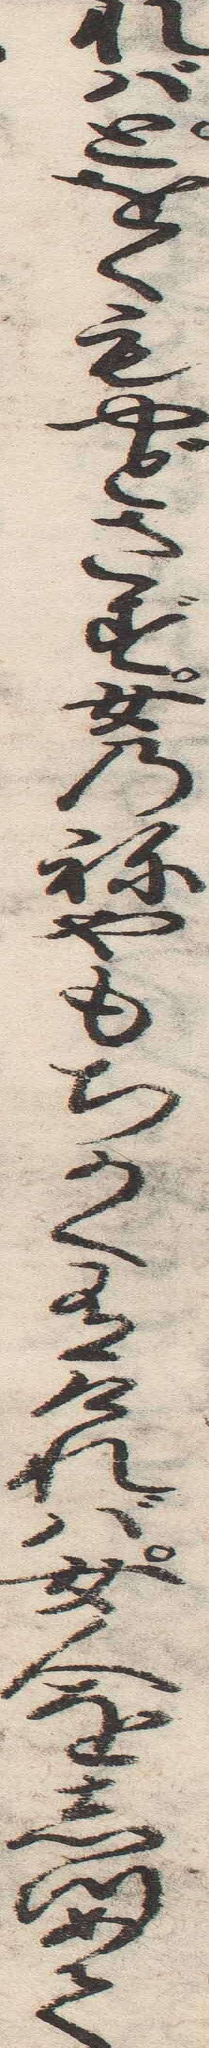れば。とをくもやどさず。女のねやもちかく有ければ。女人をしつめて
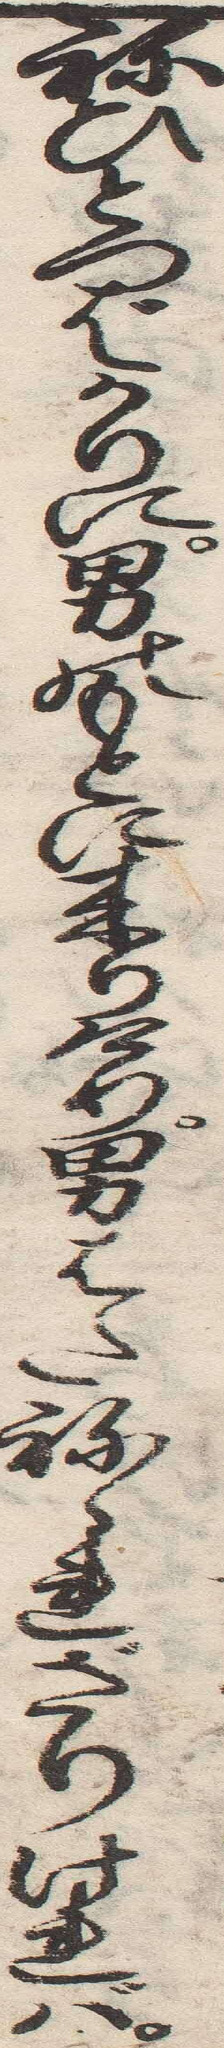ねひとつばかりに。男のもとに来りけり。男はたねられざりければ。
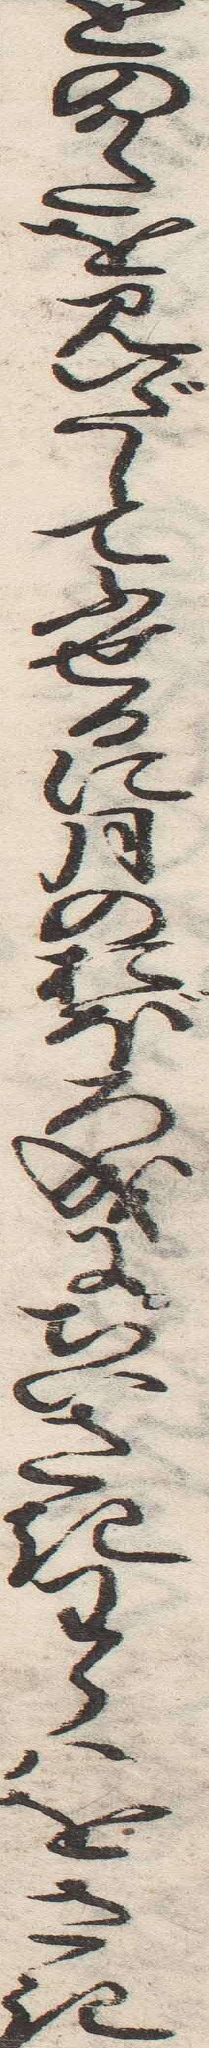とのかたを見いだしてふせるに月のおぼろ成に。ちいさきわらはをさき
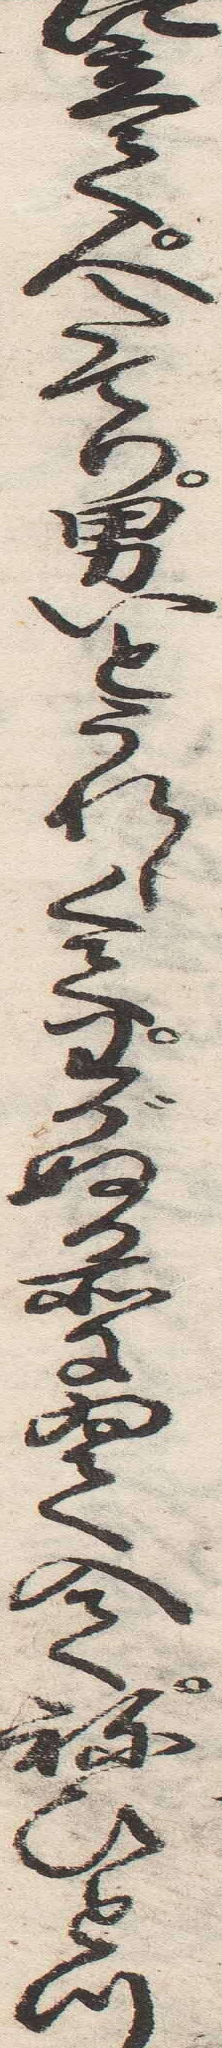に立て。人たてり。男いとうれしくて。わがねる所にゐて入て。ねひとつ
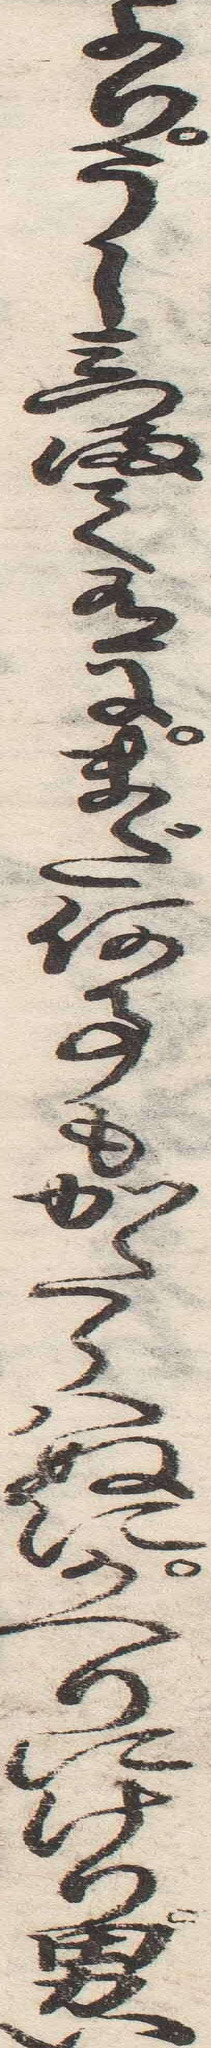より。うし三つまて有に。まだ何事もかたらはぬに。かへりにけり。男い
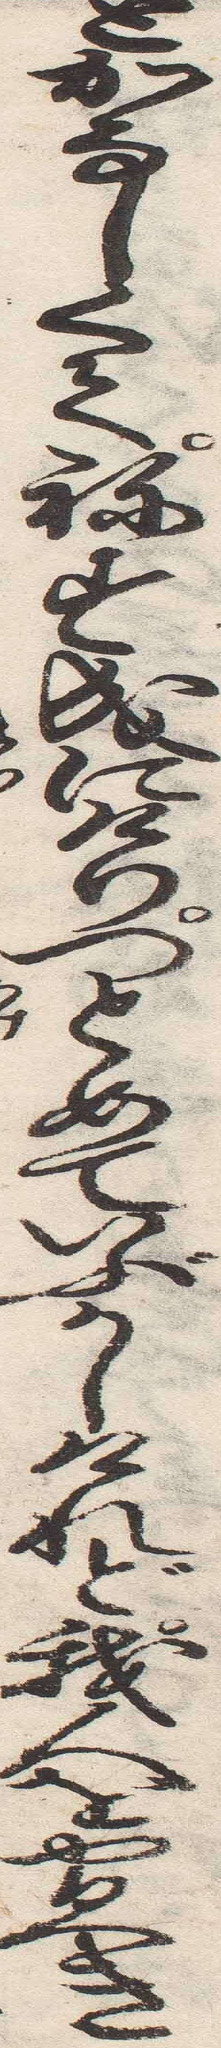とかなしくて。ねす成にけり。つとめていぶかしけれど。我人をやるへき
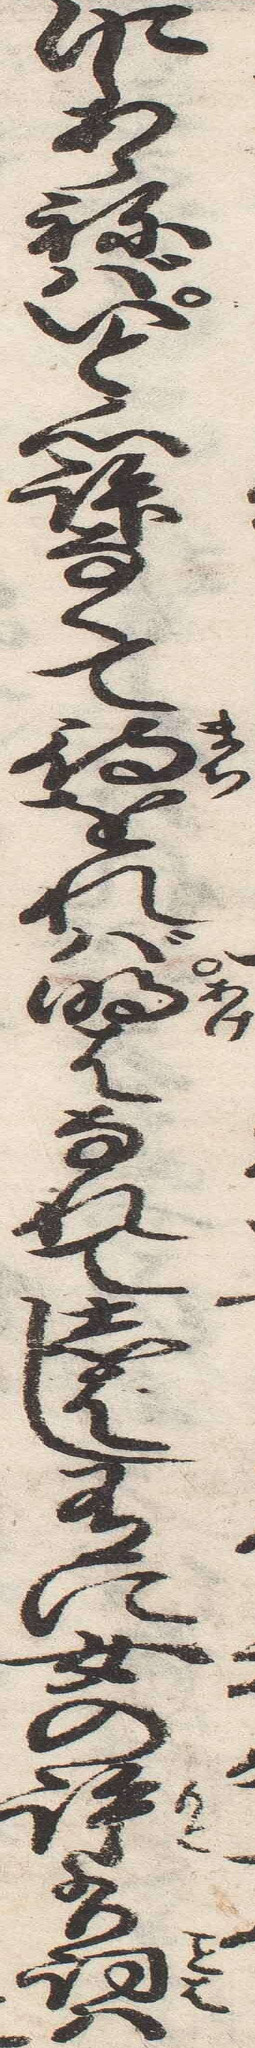にしあらねば。いと心許なくて待をれば。明はなれてしはし有に女の許より詞なくて
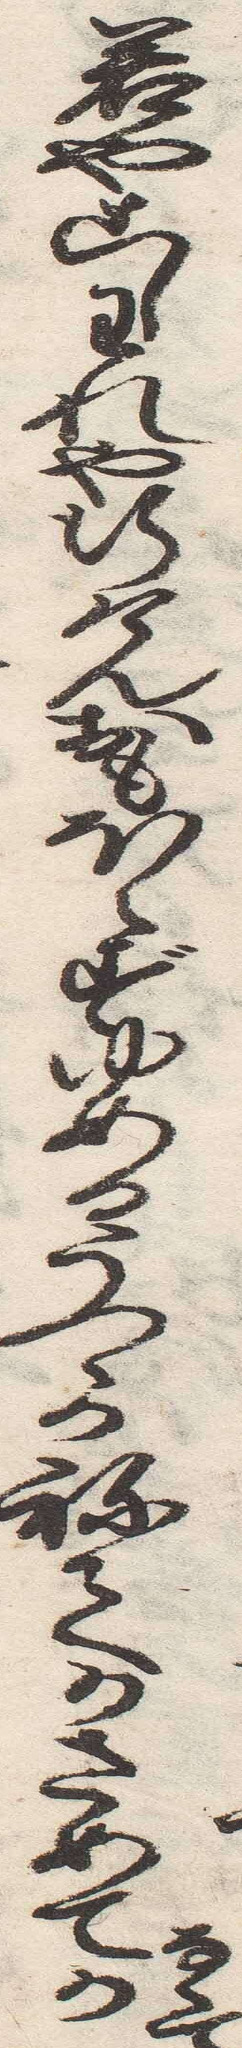君やこしわれや行けんおもほえずゆめかうつゝかねてかさめてか
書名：伊勢物語
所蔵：東京学芸大学附属図書館 国文学研究資料館
